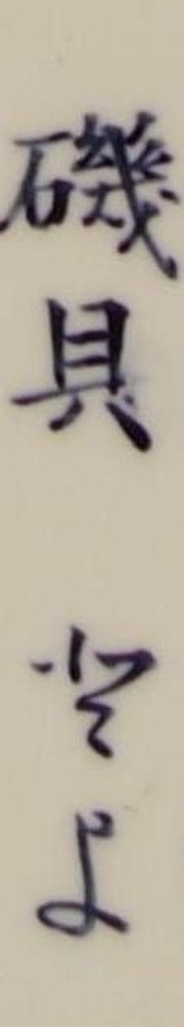磯貝とよ
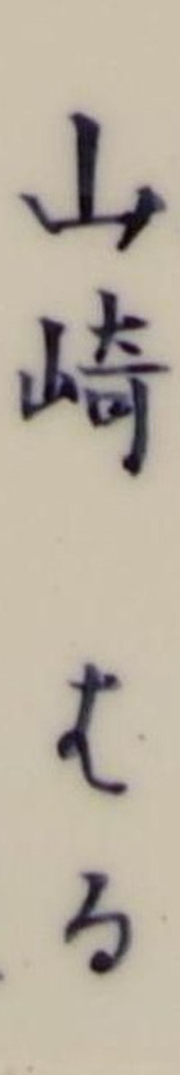山崎はる
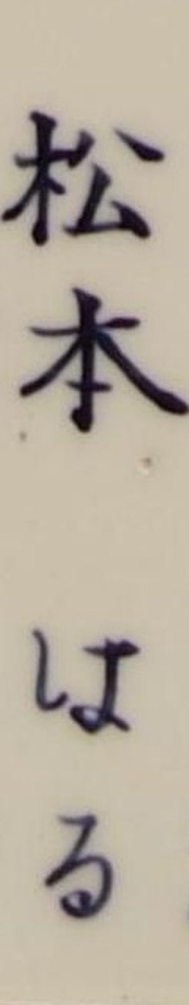松本はる
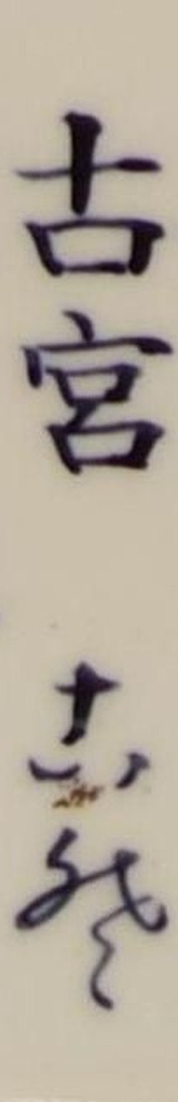古宮こそ
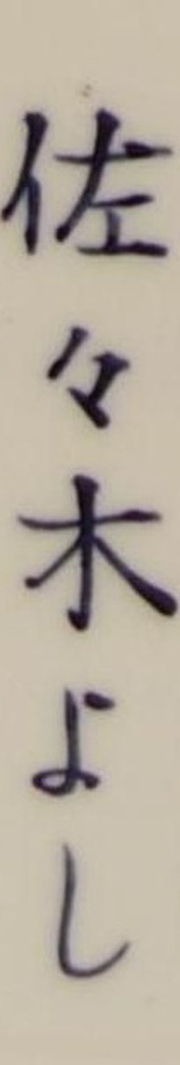佐々木よし
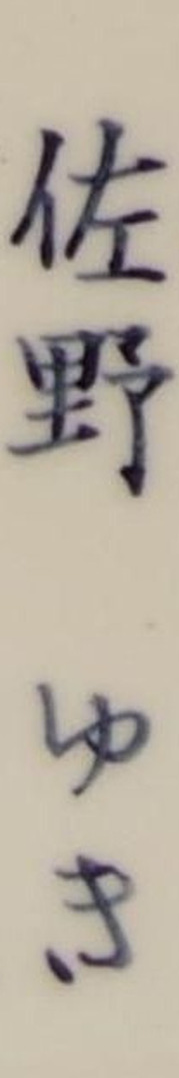佐野ゆき
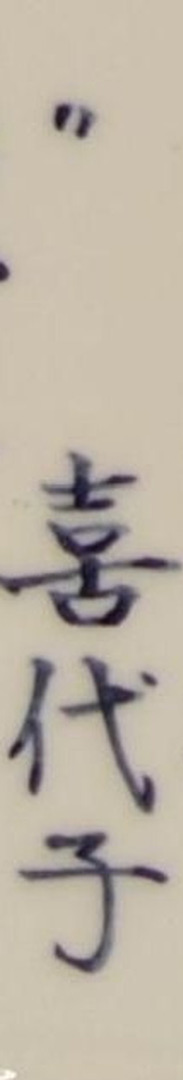喜代子
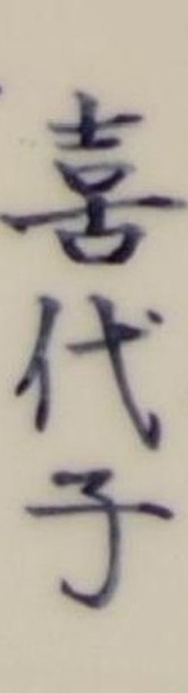喜代子
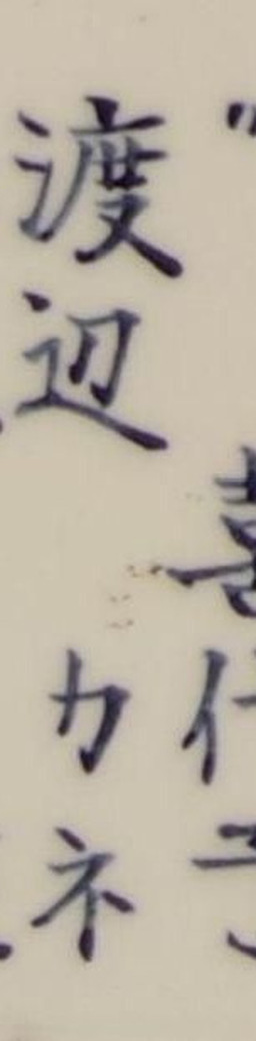渡辺力ネ
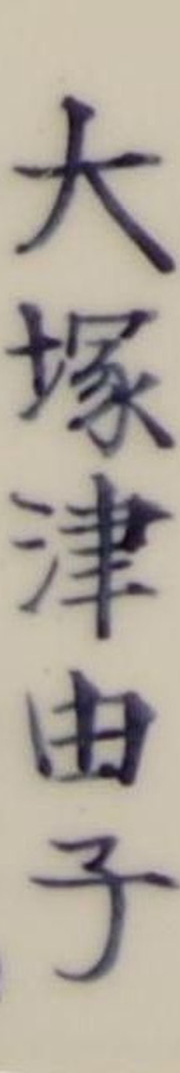大塚津由子
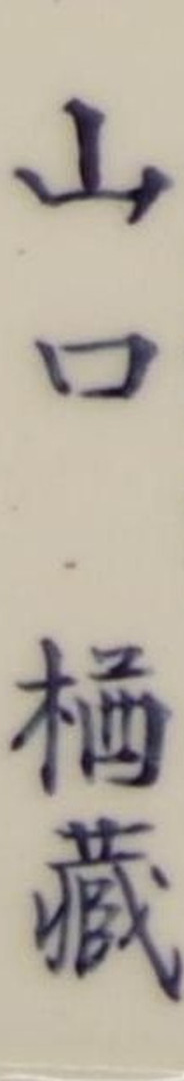山口楢蔵

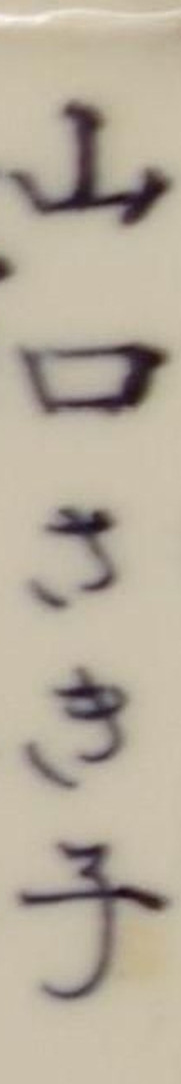山口さき子
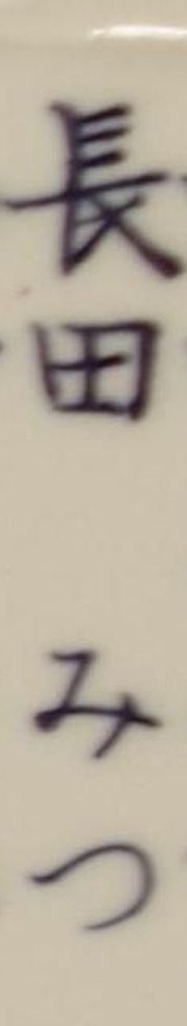長田みつ
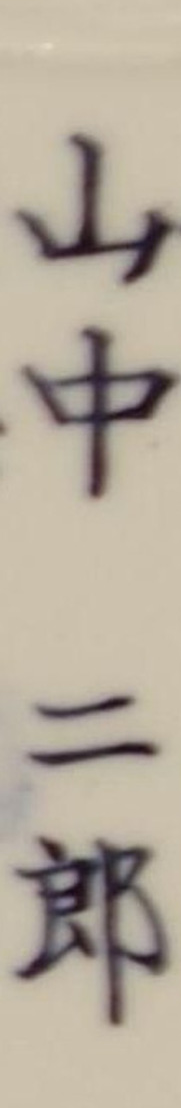山中二郎
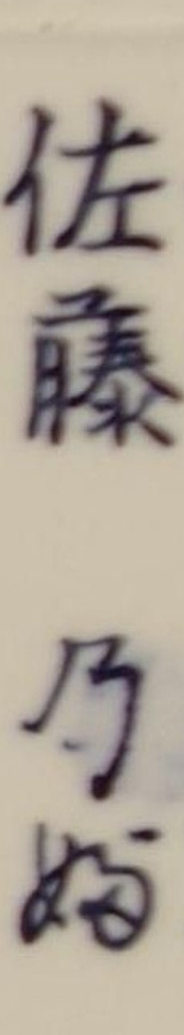佐藤のぶ
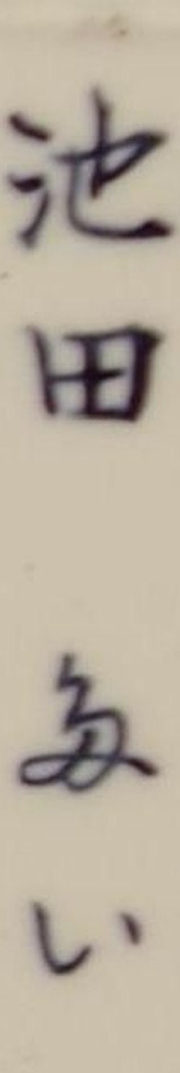池田たい
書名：M~S
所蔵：高野山金剛峯寺
